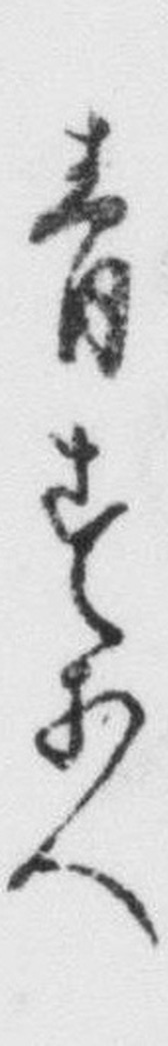青すあへ
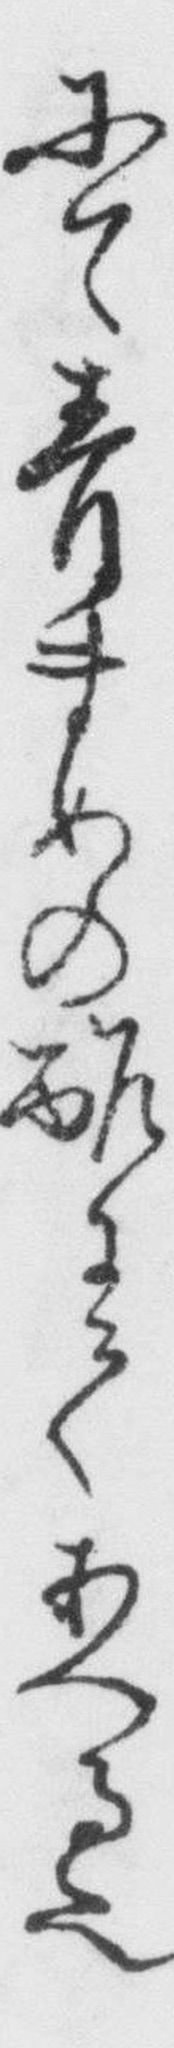にて青まめの酢にてあへる也
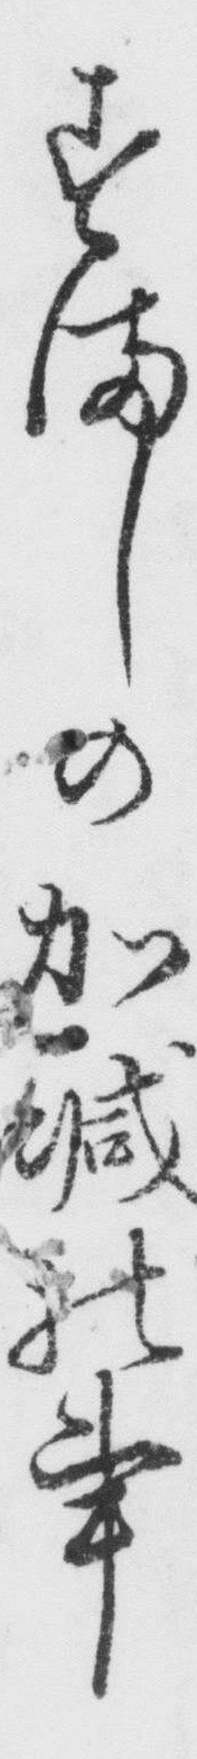すましの加減の事
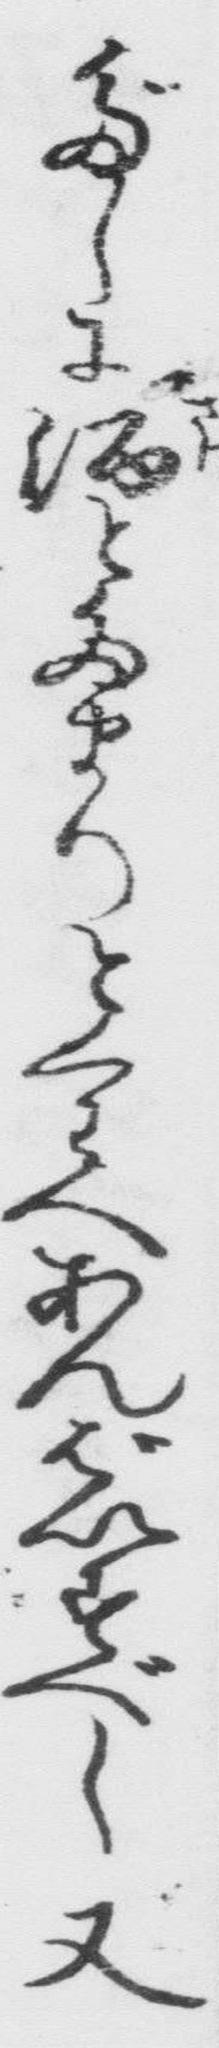だしに酒とたまりとくわへあんばいすべし又
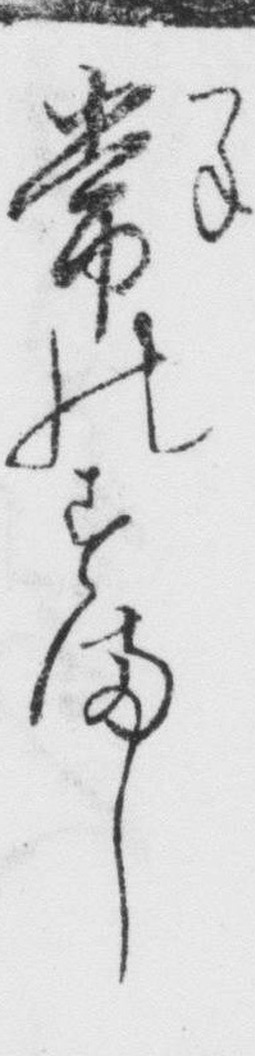常のすまし
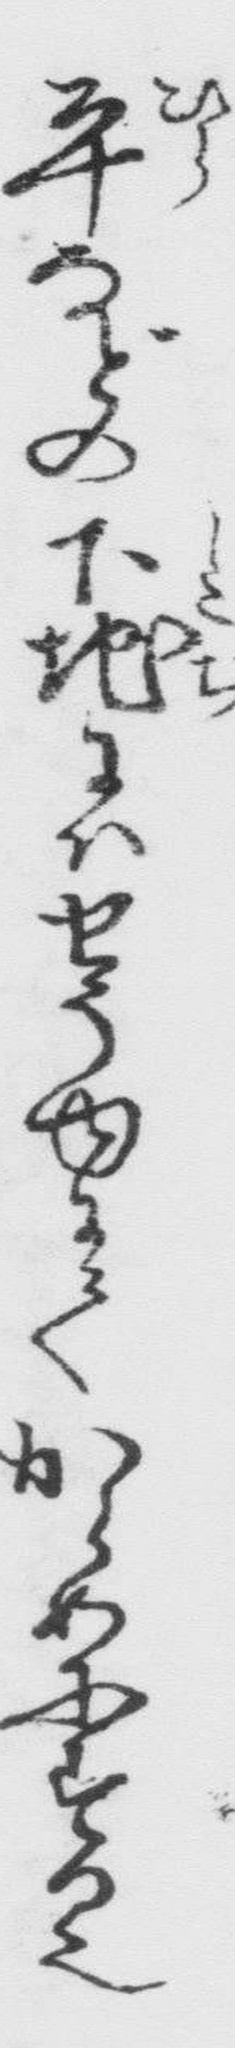平などの下地にはせうゆにてからめにする也
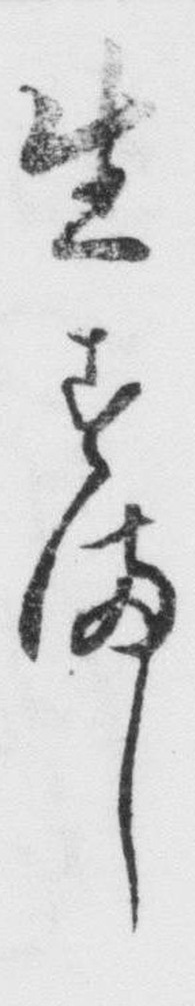生すまし
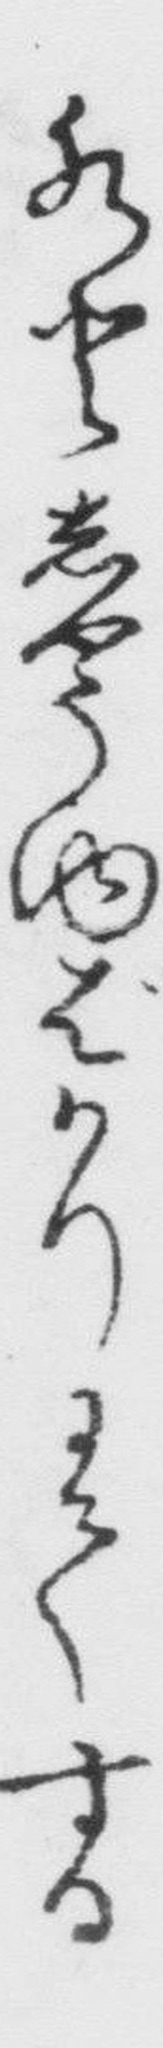水としやうゆばかりにてする
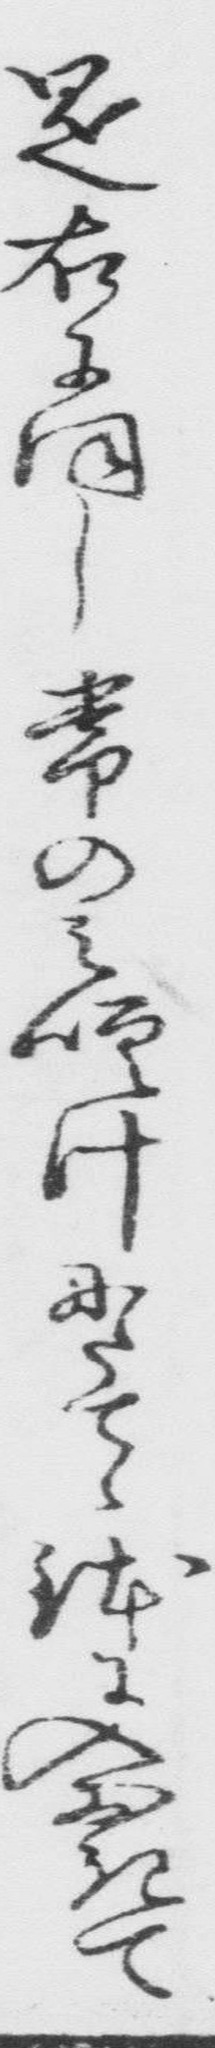是右に同し常のみ噌汁にたてゝ鉢に入おきて
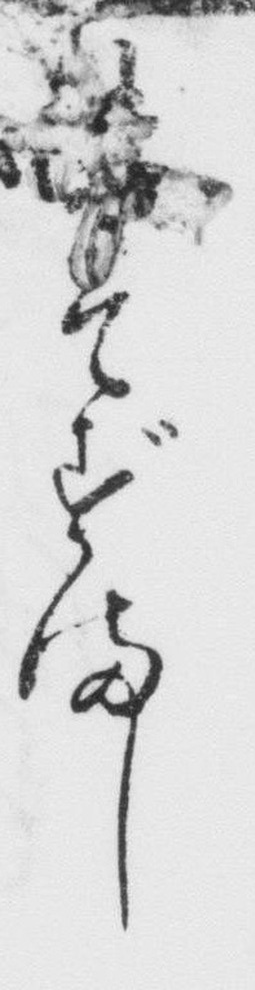わさびずまし
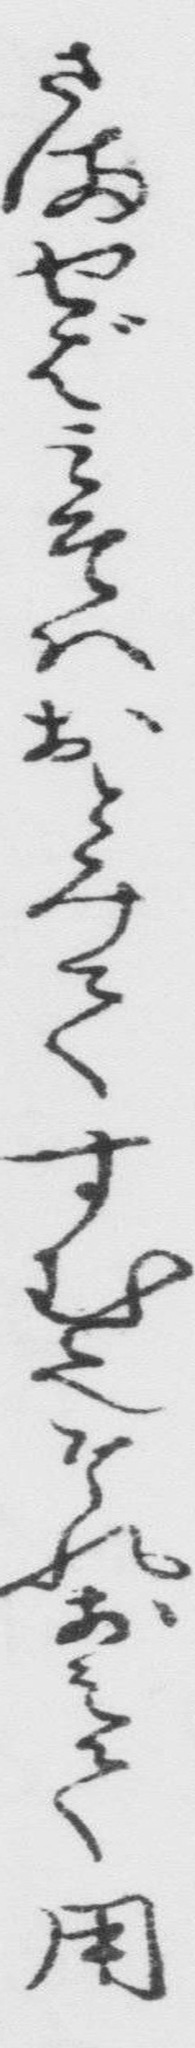さませばみそはおとみてすむ也それをみて用
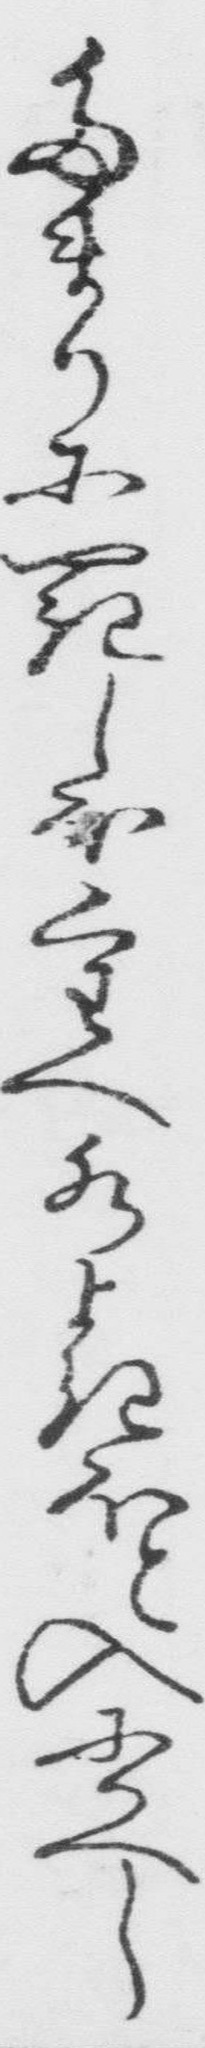たまりにやきしほくわへ水よきほと入にかへし
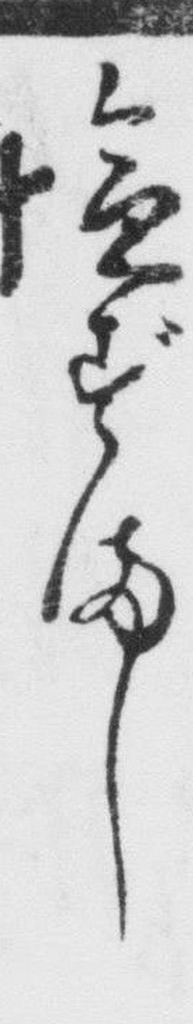塩ずまし
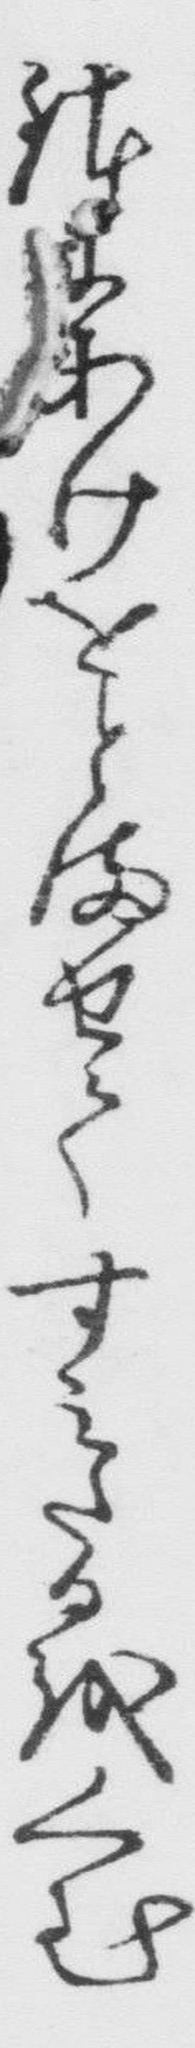鉢にあけをとませてすみたるをくむ
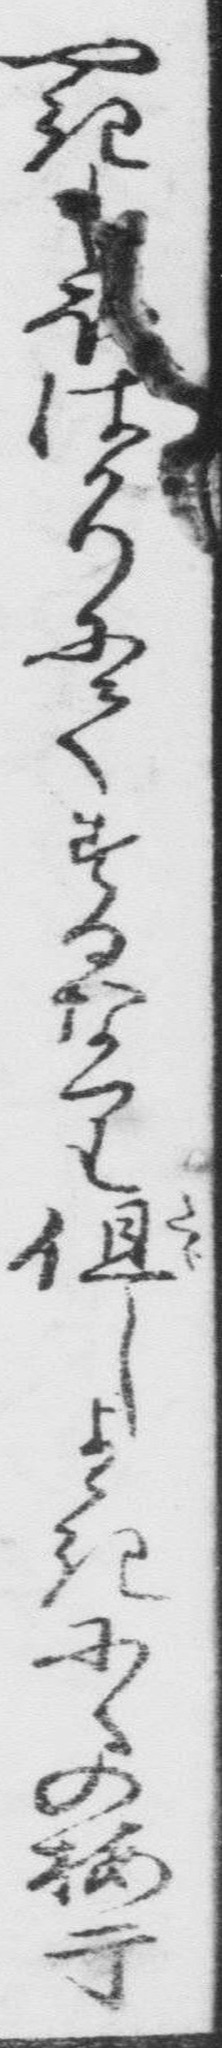やきしほはかりにてするなり但しよきにくの梅干
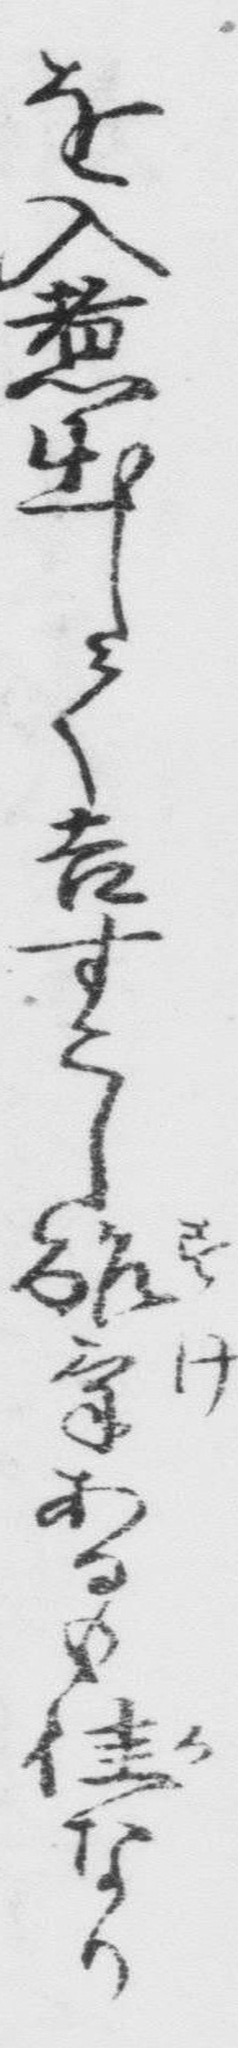を入煮出して吉すこし酢気あるのも佳なり
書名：料理早指南
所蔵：大阪府立大学学術情報センター 国文学研究資料館
